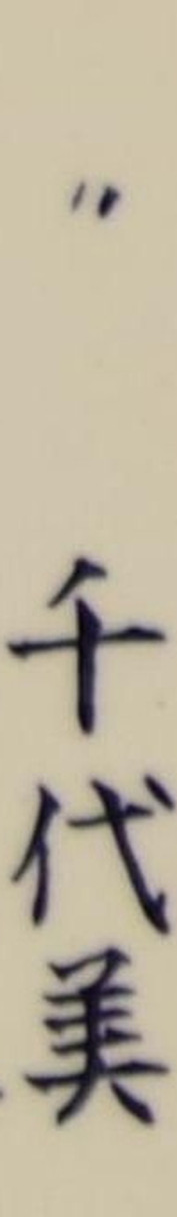千代美
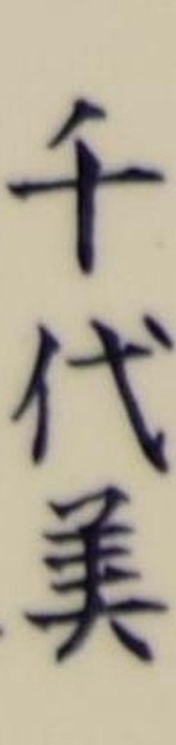千代美

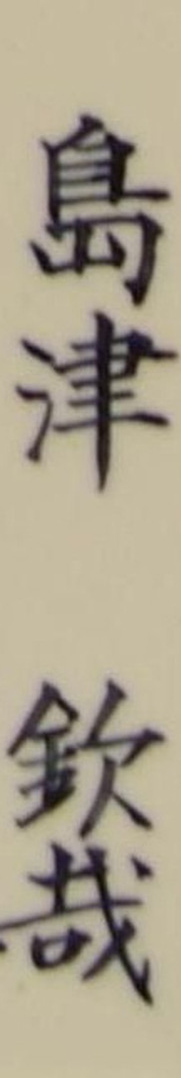島津欽哉
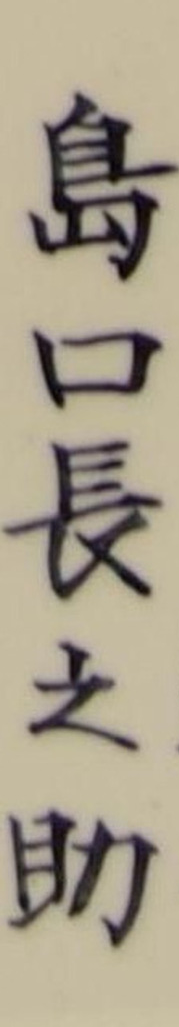島口長之助
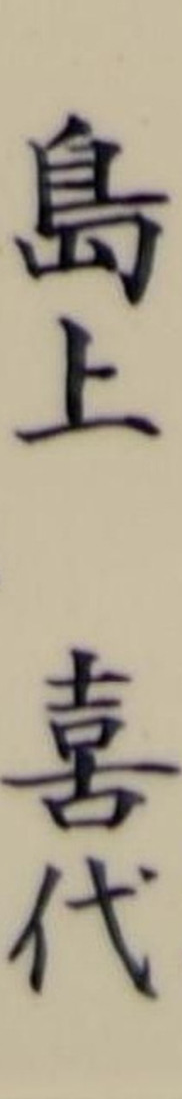島上喜代
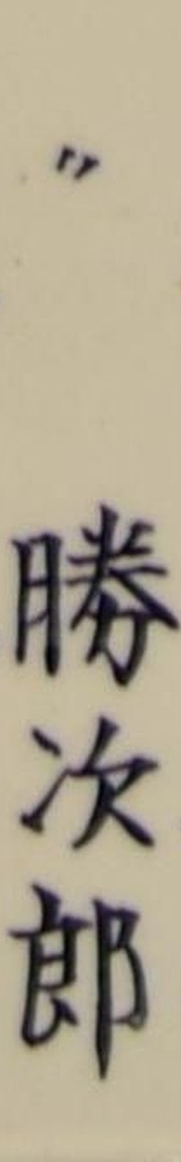勝次郎
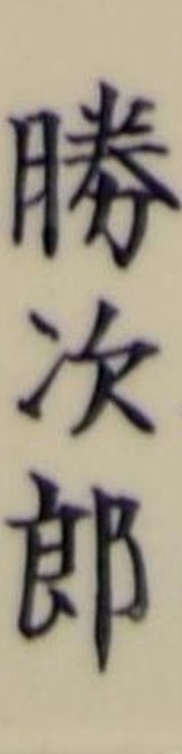勝次郎
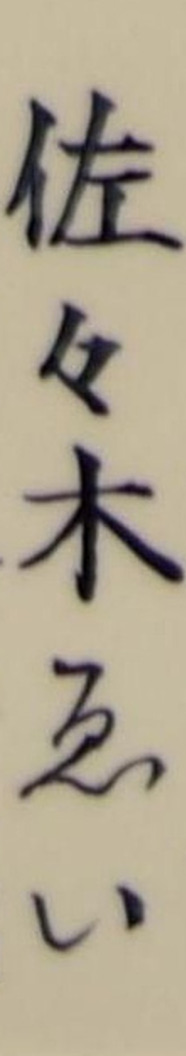佐々木ゑい
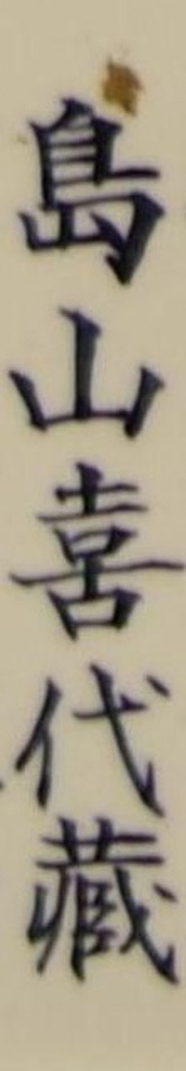島山喜代蔵
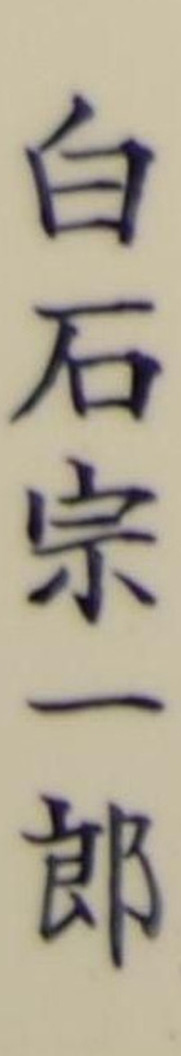白石宗一郎
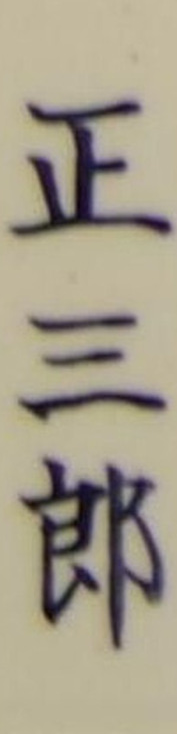正三郎

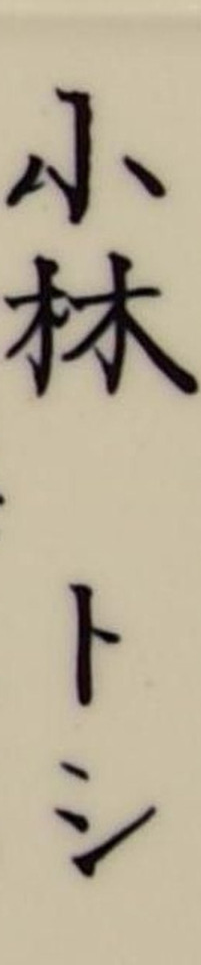小林トシ
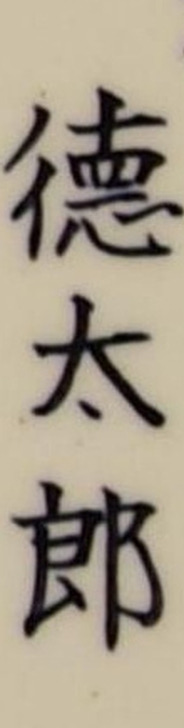徳太郎
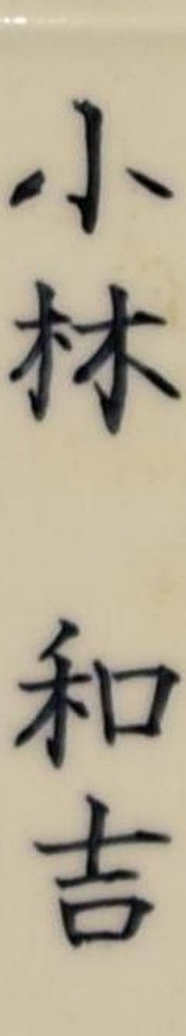小林和吉
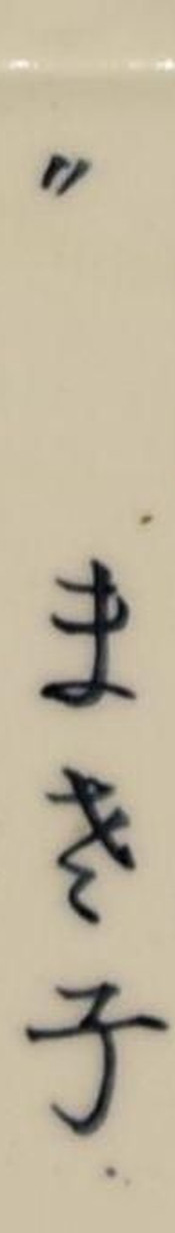まき子
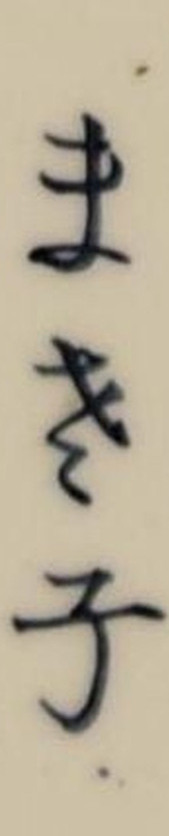まき子
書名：A~D
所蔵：koyasan kongobuji
